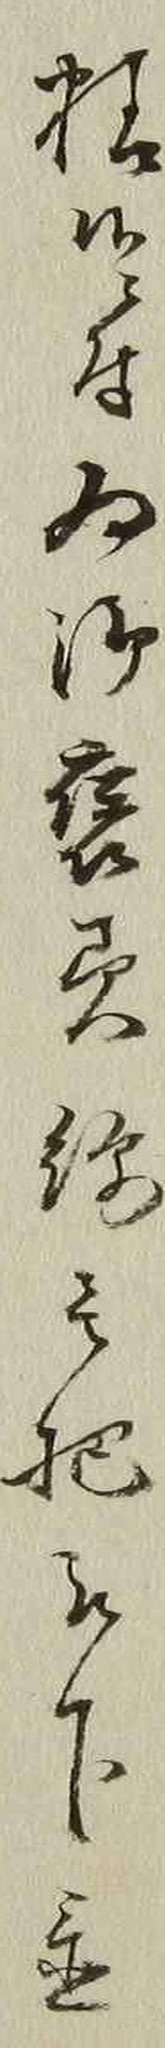精候ニ付為御褒美綿壱把被下置
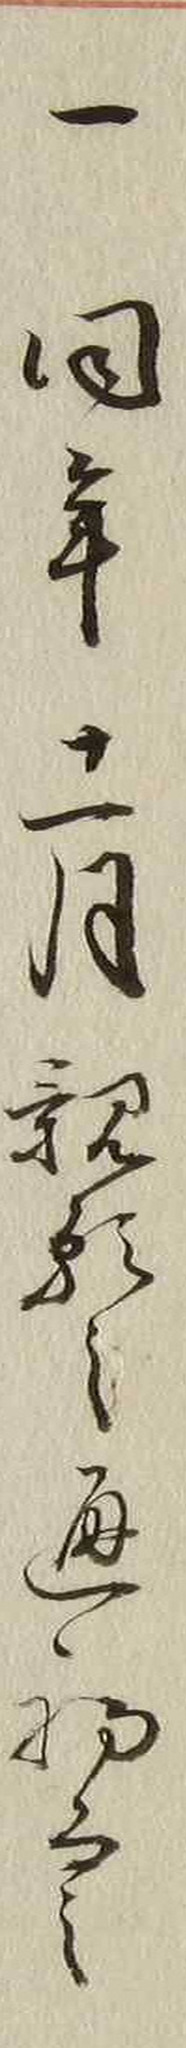一同年十一月親願之通初而之
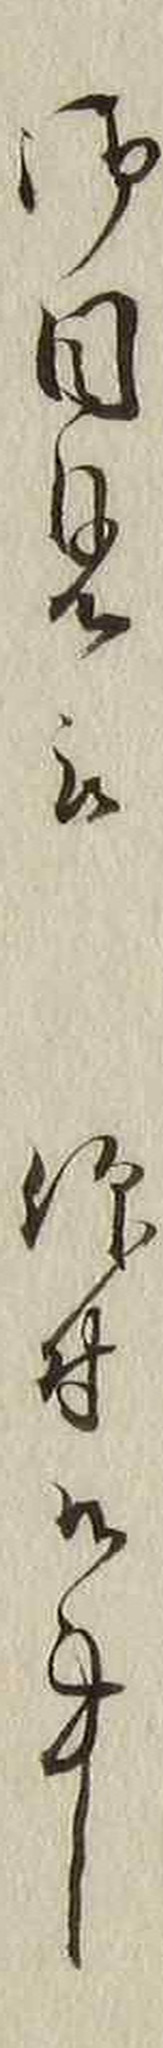御目見被仰付候事
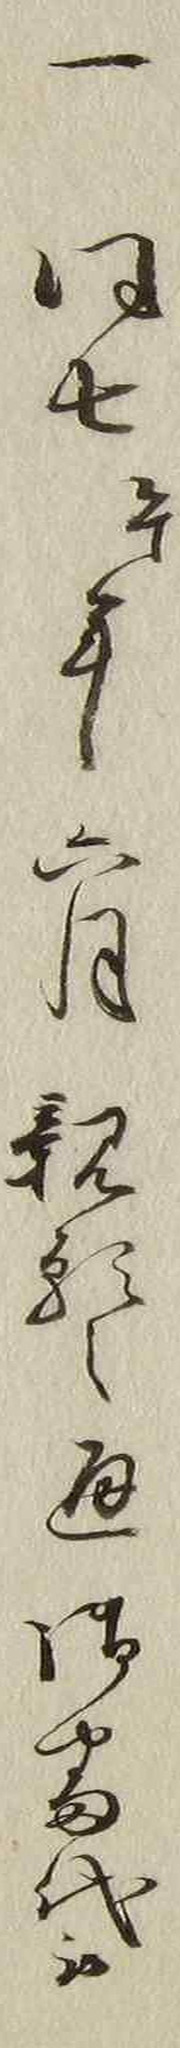一同七午年六月親願之通御番代被
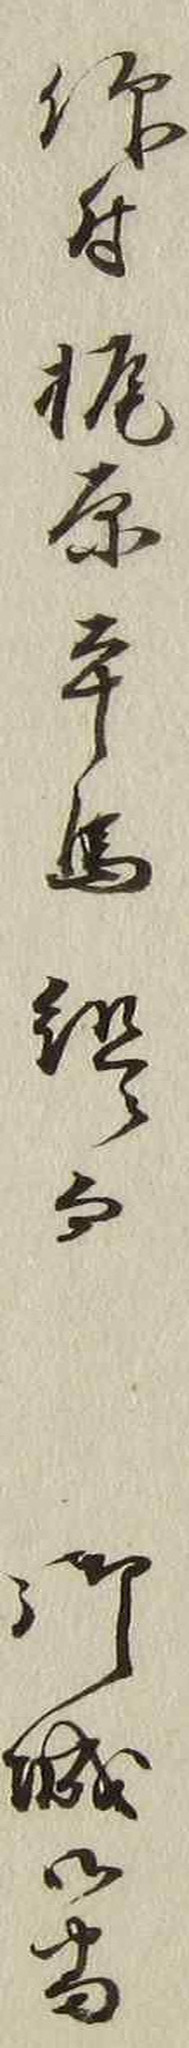仰付梶原平馬組ニ而御城御番
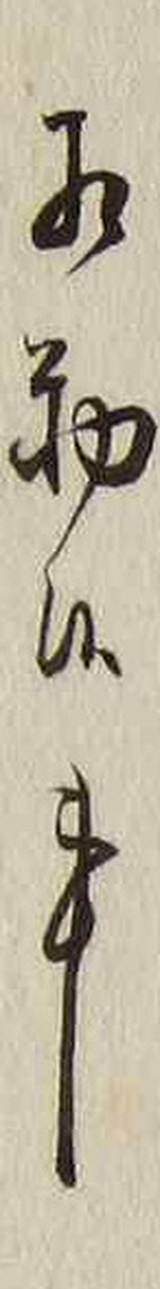相勤候事
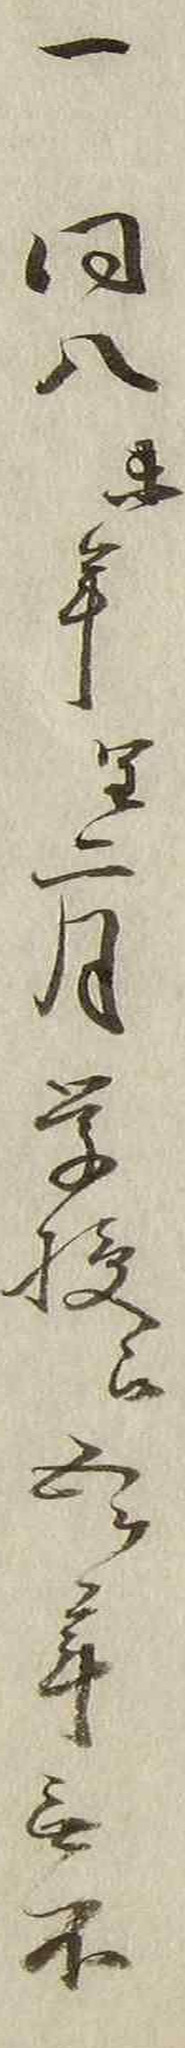一同八未年閏二月学校江五ケ年無不
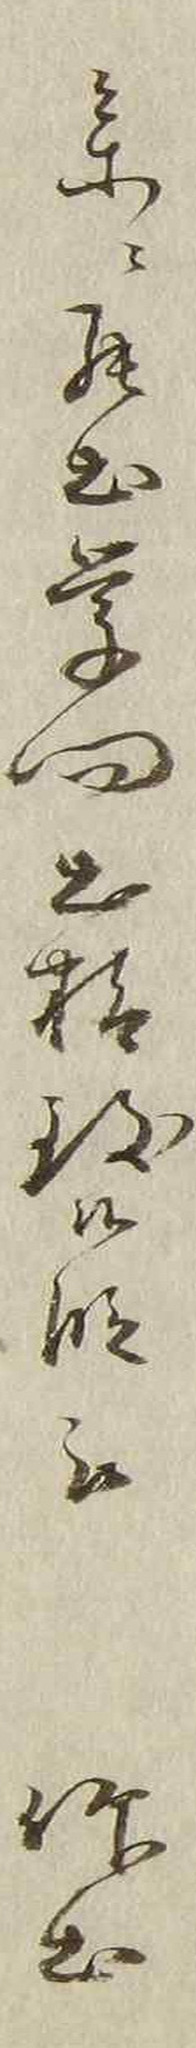参ニ罷出学問出精致候段被仰出

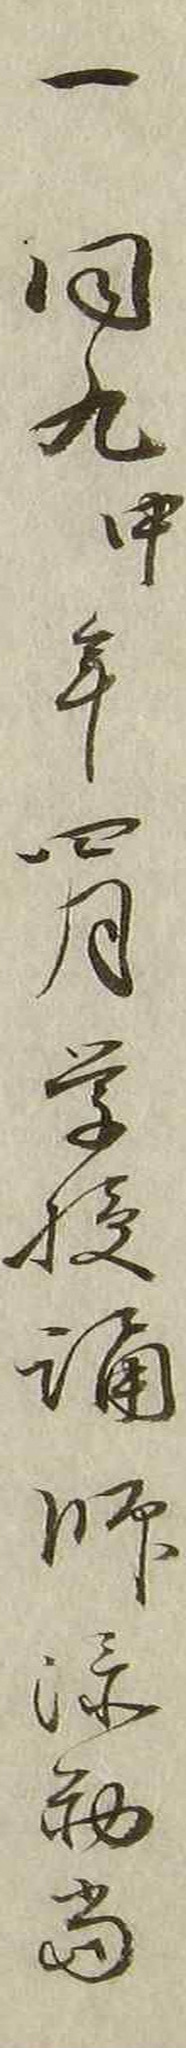一同九申年四月学校誦師添勤当
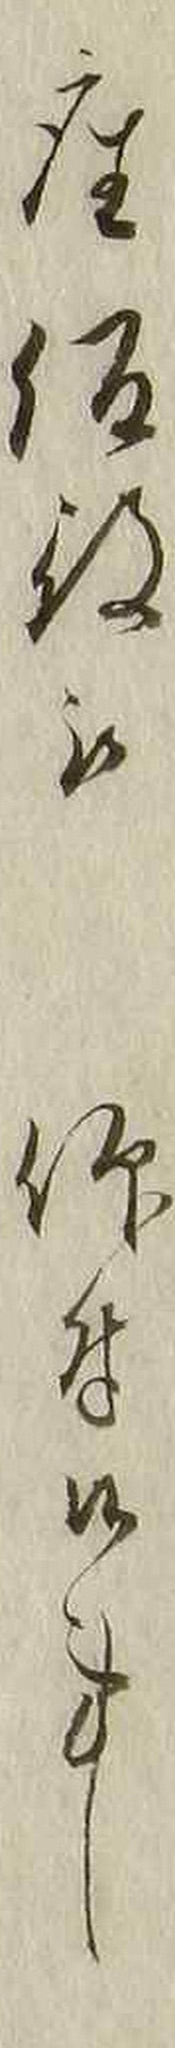座仮役被仰付候事
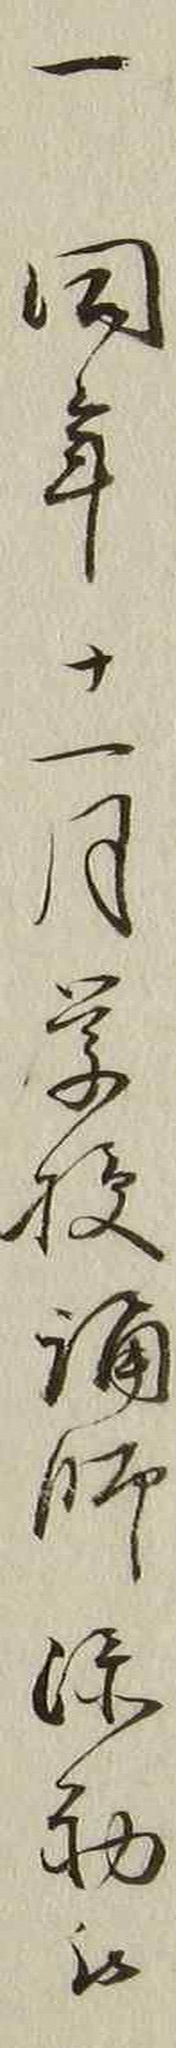一同年十一月学校誦師添勤被
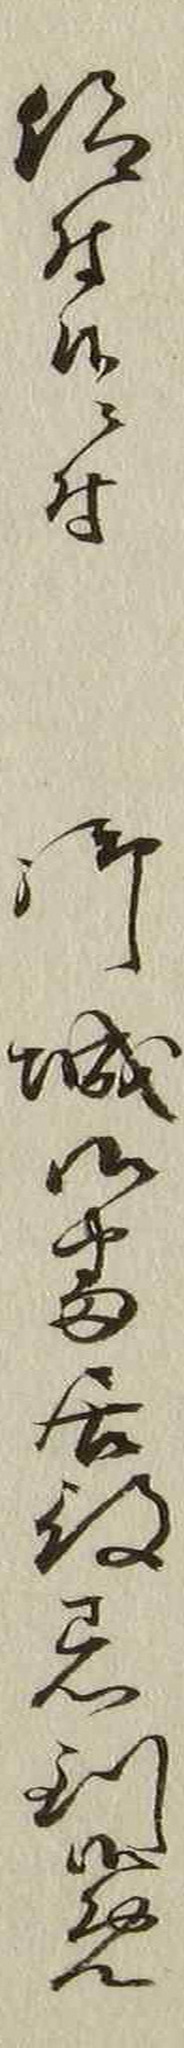仰付候ニ付御城御番居役着到御免
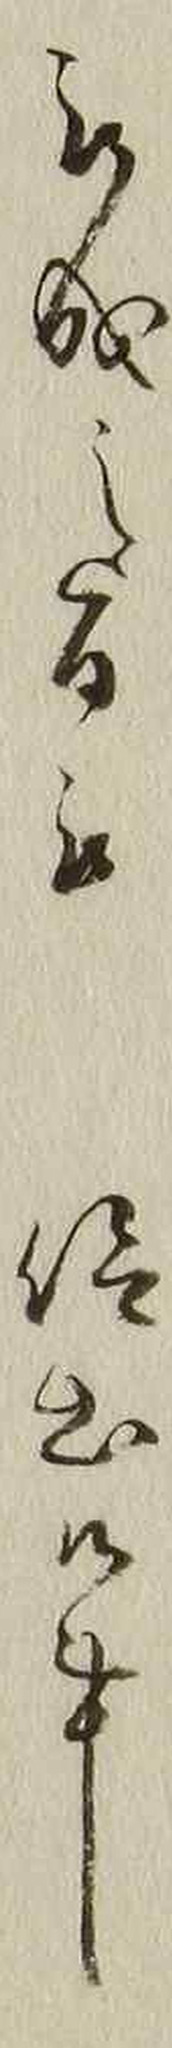被成之旨被仰出候事
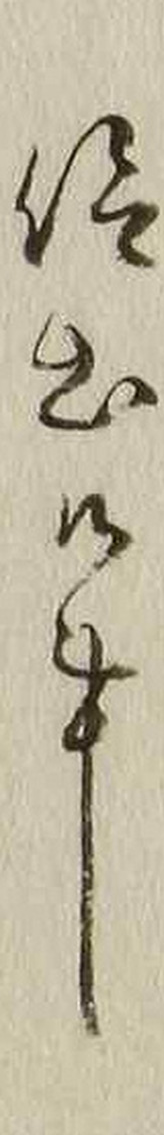仰付候事
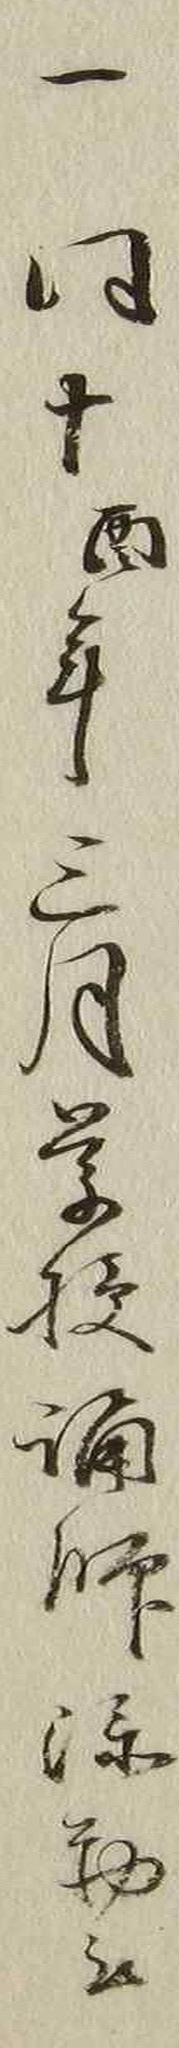一同十酉年三月学校誦師添勤被
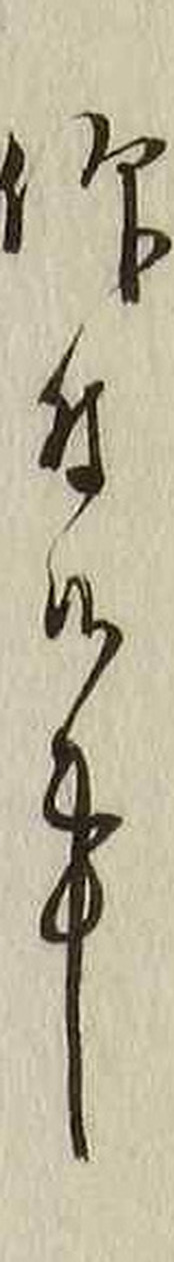仰付候事
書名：諸士系譜　巻之26　い之部26
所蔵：会津若松市立会津図書館
